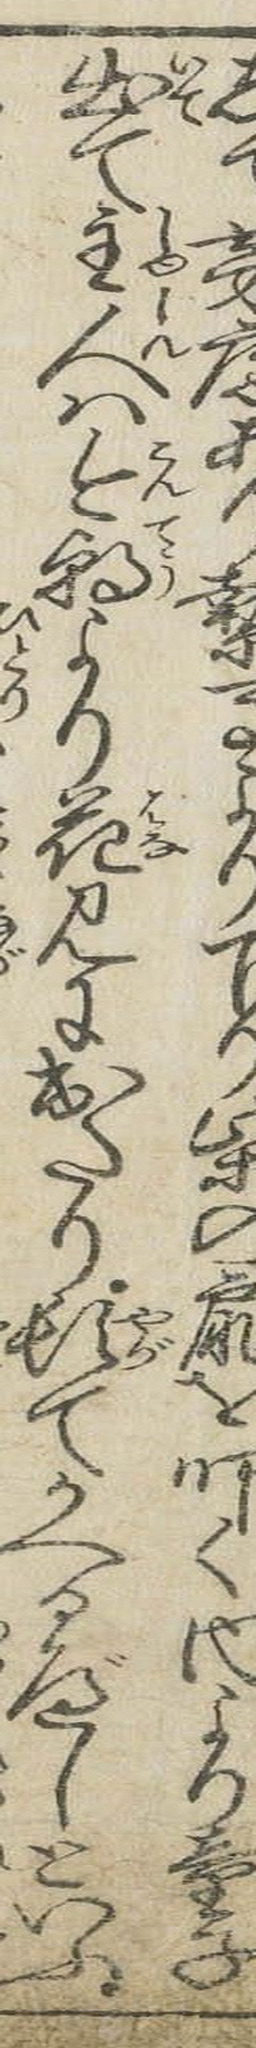出て主人は今朝より花見に出たり。頓てかへるべしといふ。
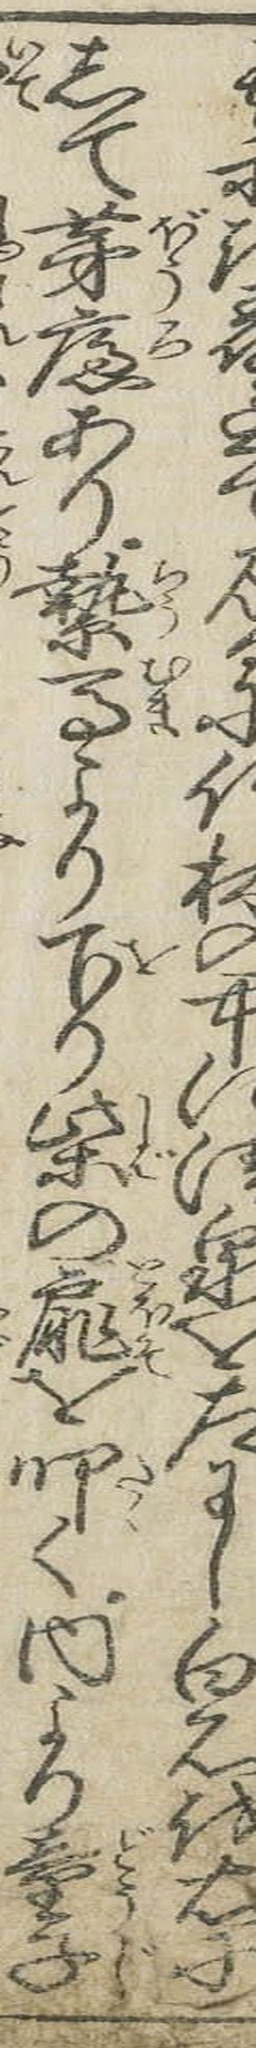して茅廬あり。縶馬より下り柴の扉を叩く。内より童子
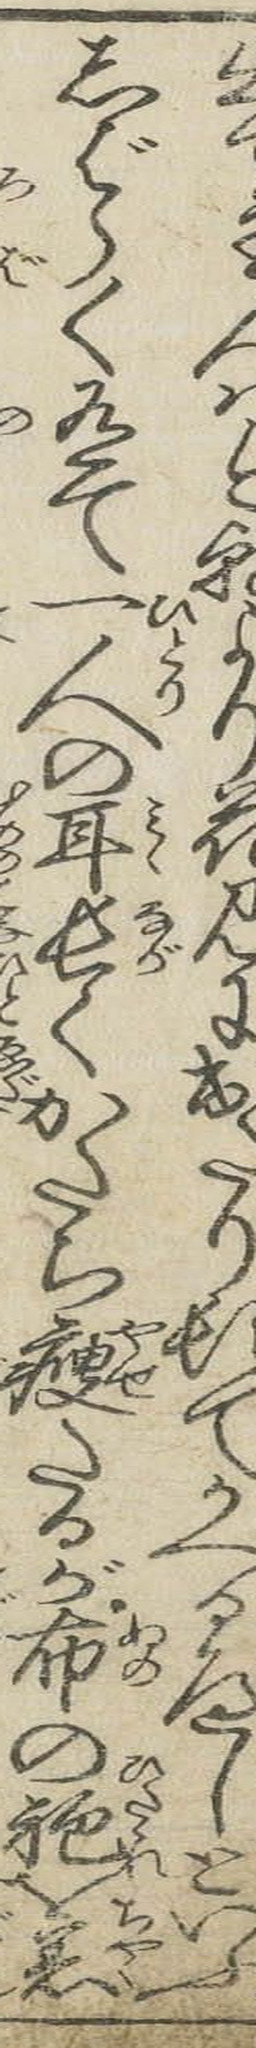しばらく有て一人の耳長くかたち痩たるが。布の袍を着
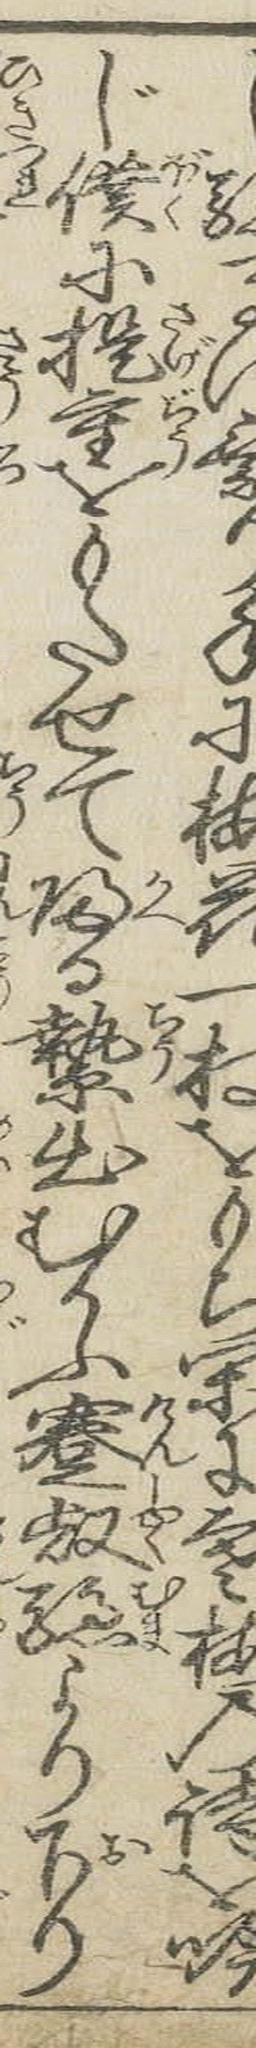じ僕に提重をもたせて帰る縶出むかふ蹇叔驢より下り
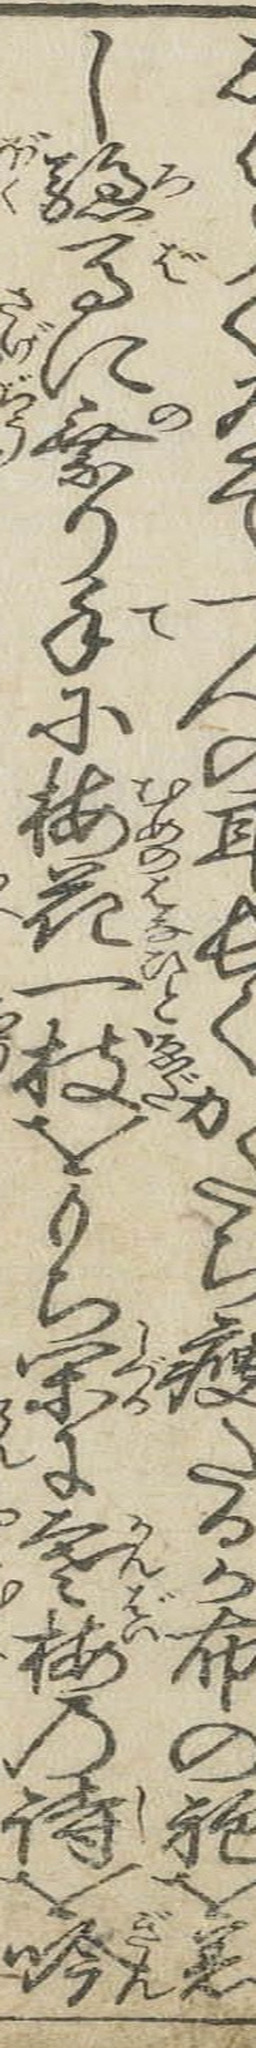し驢馬に乗り手に梅花一枝をもち閑に寒梅の詩を吟
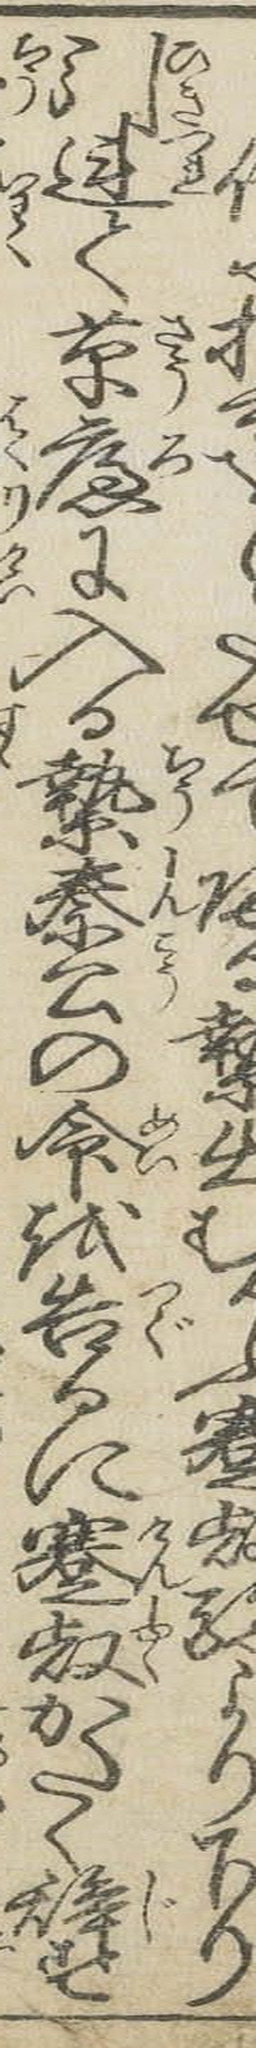引連て草廬に入る縶秦公の命を告るに蹇叔かたく辞す
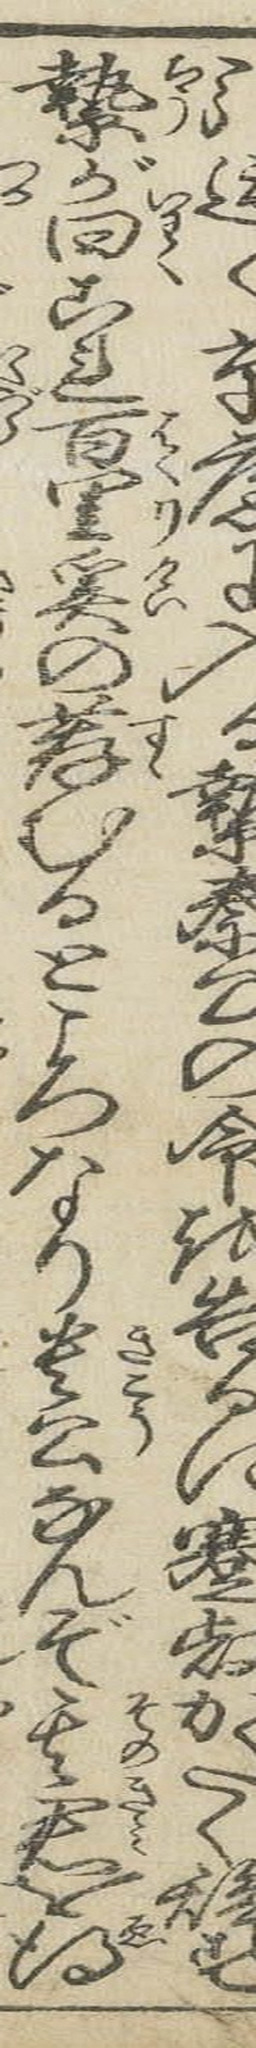縶が曰これ百里奚の薦むるところなり貴公なんぞ其君を得
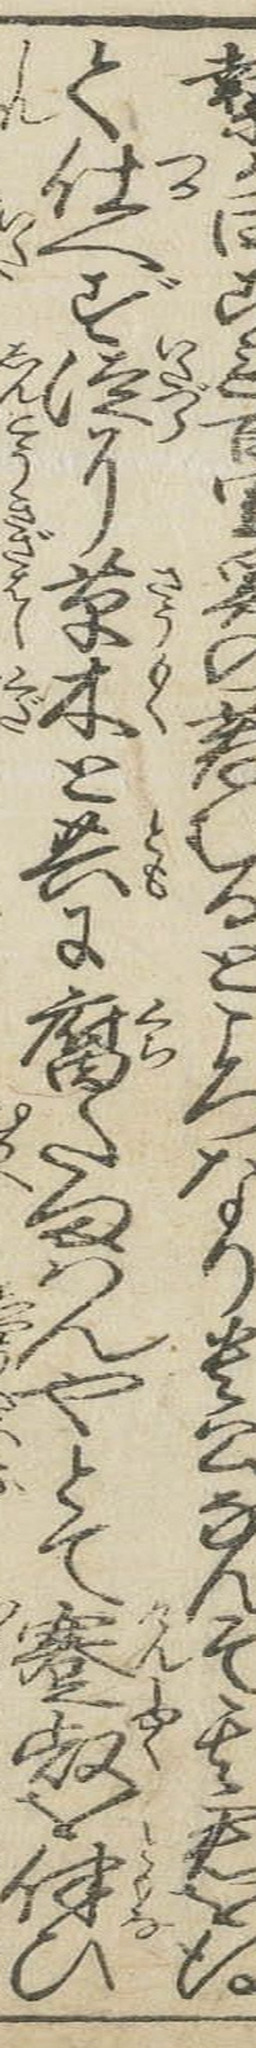て仕へず徒に草木と共に腐たまはんやとて蹇叔を伴ひ
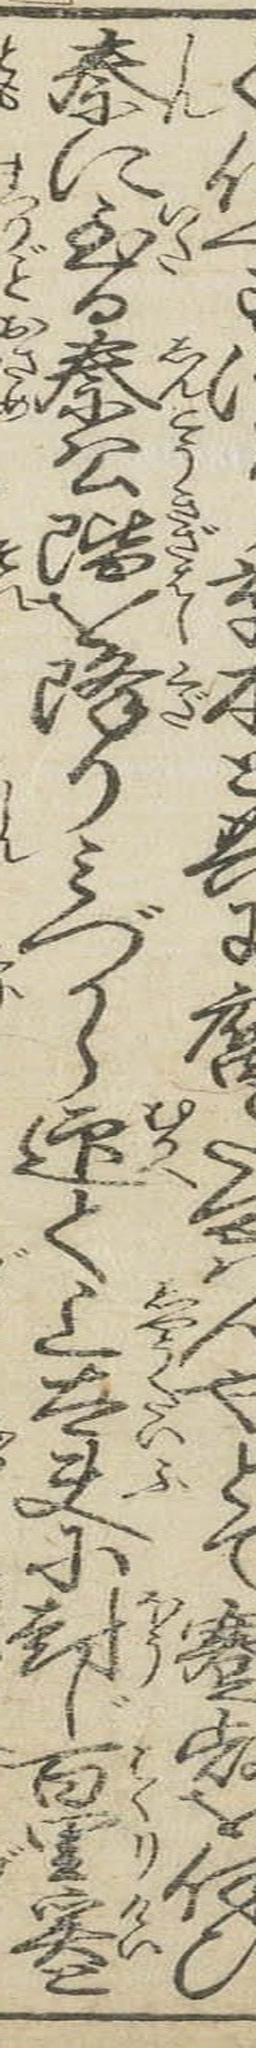秦に至る秦公階を降りみづから迎て上太夫に封じ百里奚と
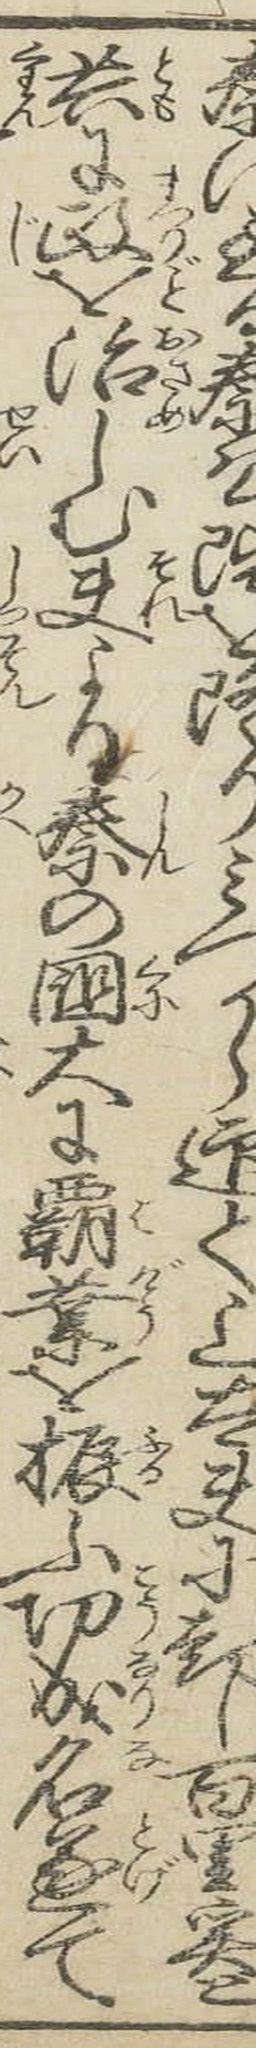共に政を治しむ夫より秦の国大に覇業を振ふ功成名遂て
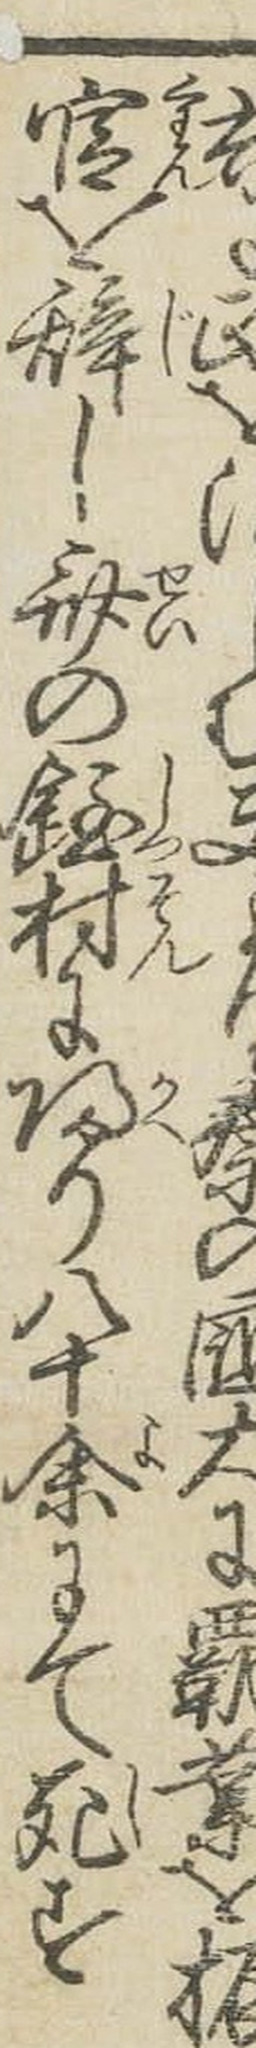官を辞し斉の䬹村に帰り八十余にて死す
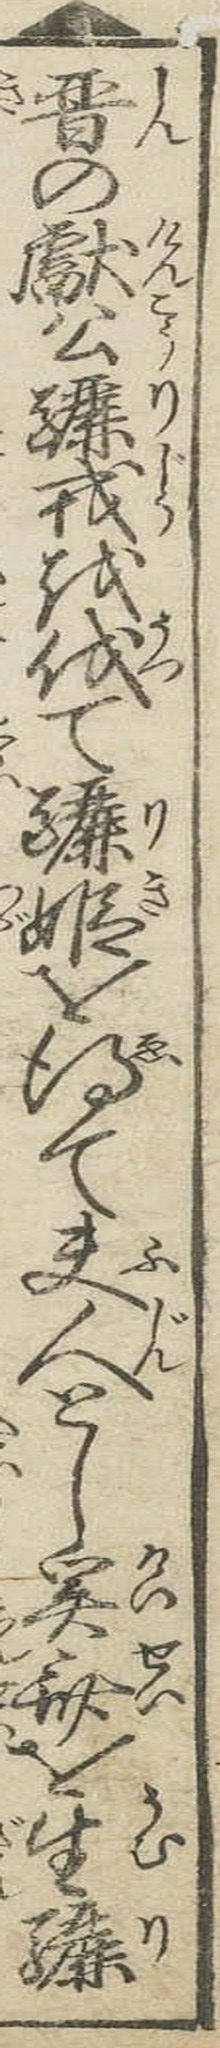晋の献公驪戎を伐て驪姫を得て夫人とし奚斉を生驪
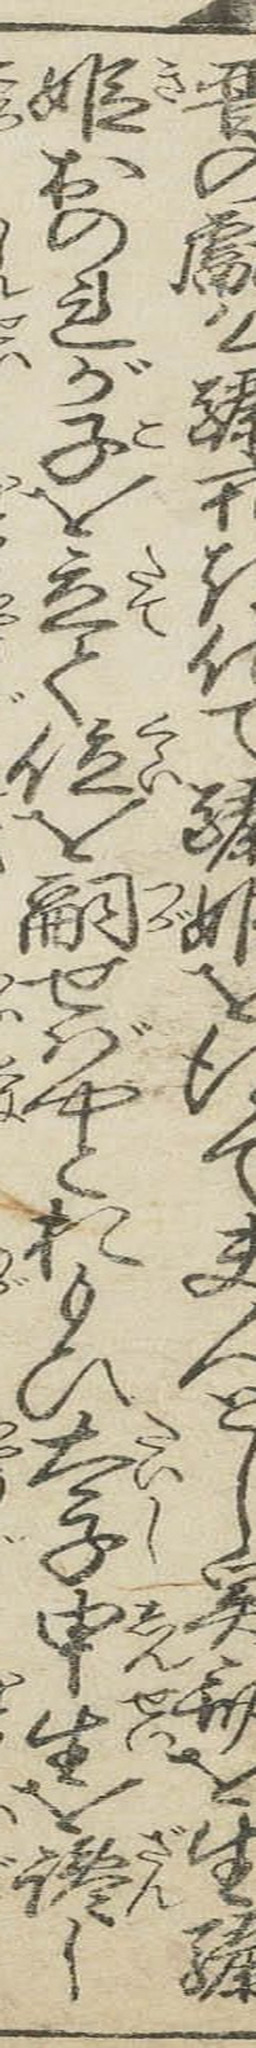姫おのれが子を立て位を嗣せばやとおもひ太子申生を讒し
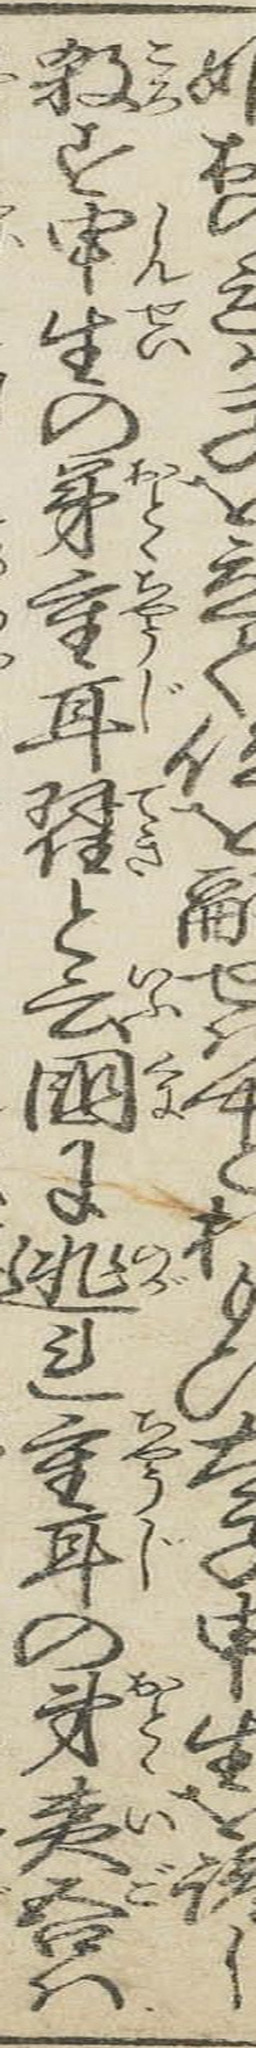殺す申生の弟重耳翟と云国に逃れ重耳の弟夷吾は
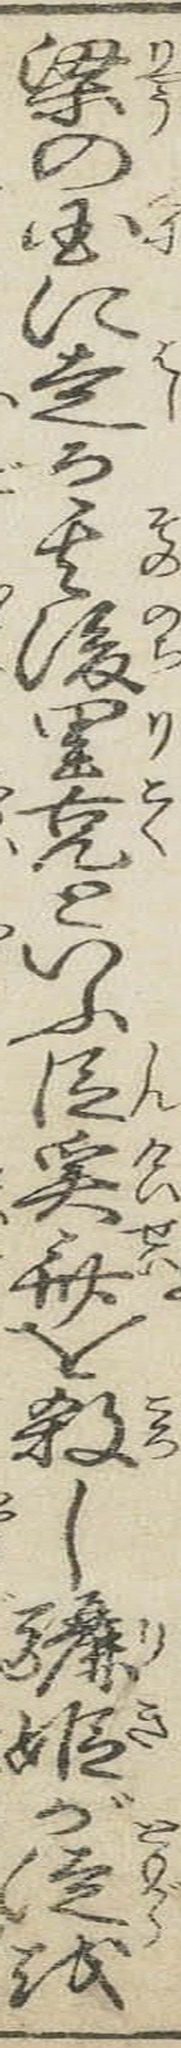梁の国に走る其後里克といふ臣奚斉を殺し驪姫が徒を
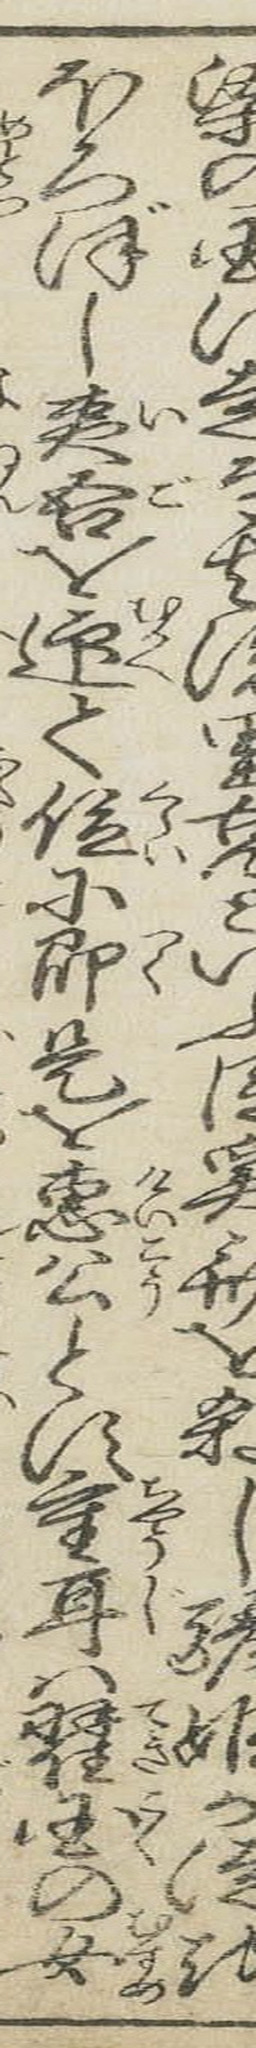ほろぼし夷吾を迎て位に即是を恵公とす重耳は翟国の女
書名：絵本写宝袋 9巻 5之巻
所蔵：東京学芸大学教育コンテンツアーカイブ
